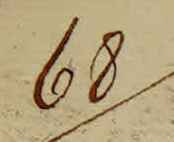68
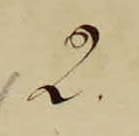2.
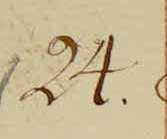24.
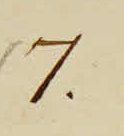7.
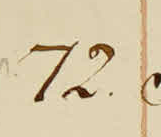72.
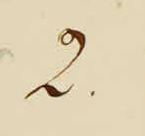2.
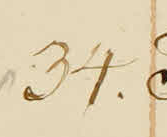34.
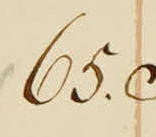65.
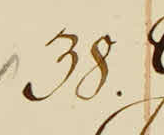38.
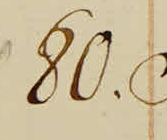80.
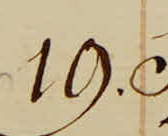19.
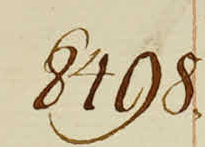8498
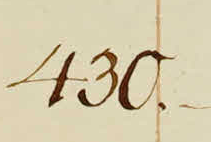430.
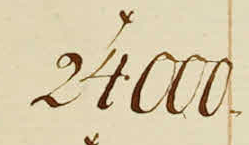24000
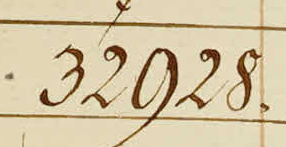32928
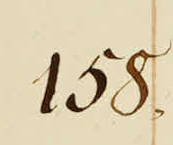158.
